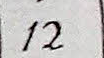12
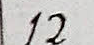12
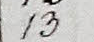13
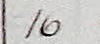16
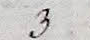3
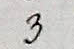3
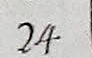24
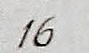16
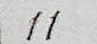11
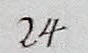24
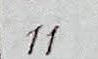11
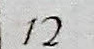12
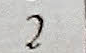2
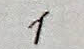1
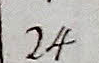24
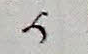5
